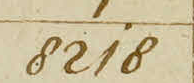8218
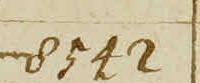8542
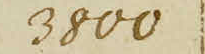3800
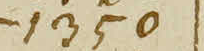1350
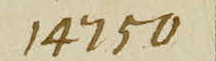14750
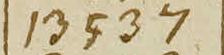13537
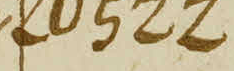26522
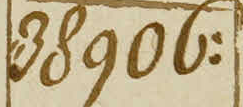38906
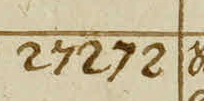27272
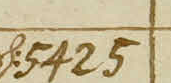5425
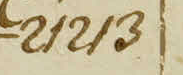21213
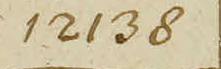12138
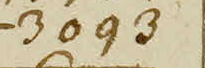3093
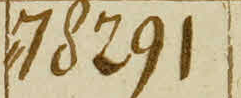78291
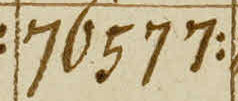76577
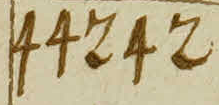44242
